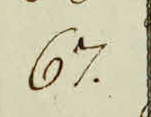67.
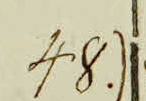48.
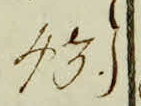43.
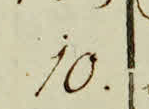10.
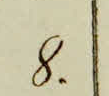8.
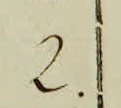2.
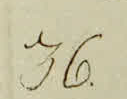36.
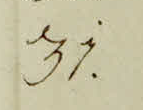37.
